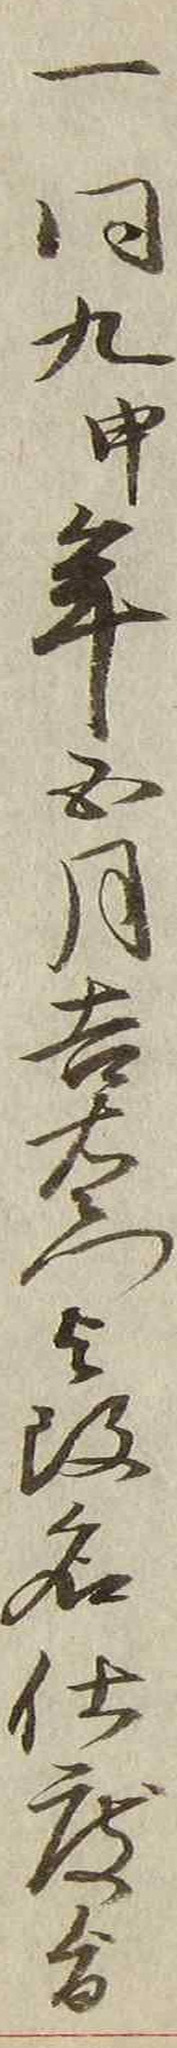一同九申年五月吉右門与改名仕度旨
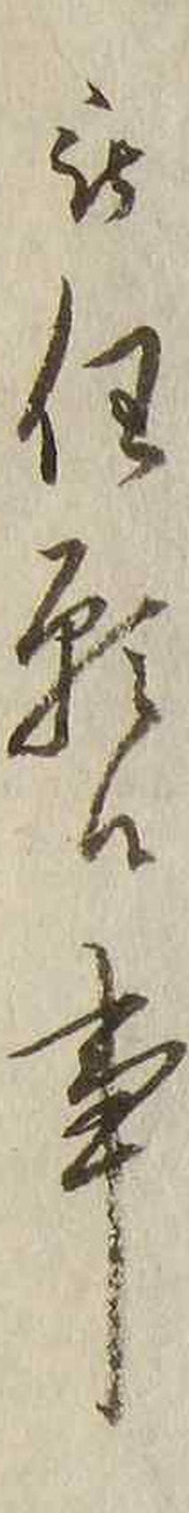被任願候事

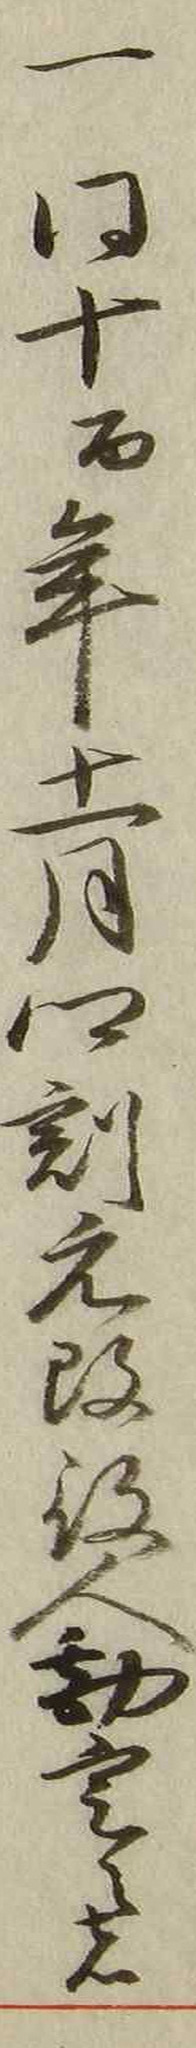一同十酉年十一月郷割元改役人勘定之者
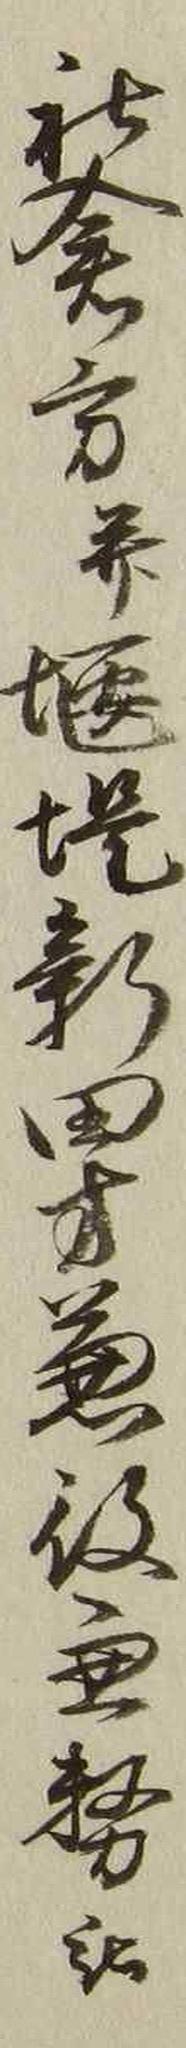社倉方并堰堤新田方兼役兼務被
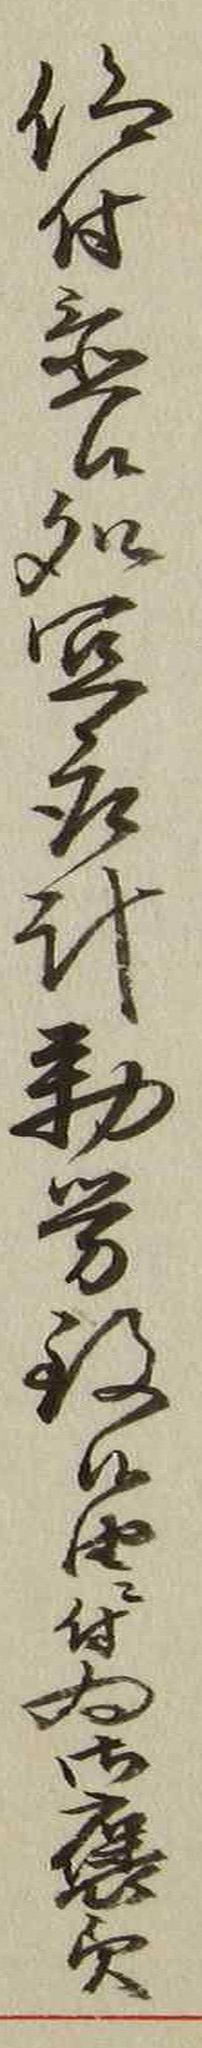仰付置候処宜取計勤労致候由ニ付為御褒美
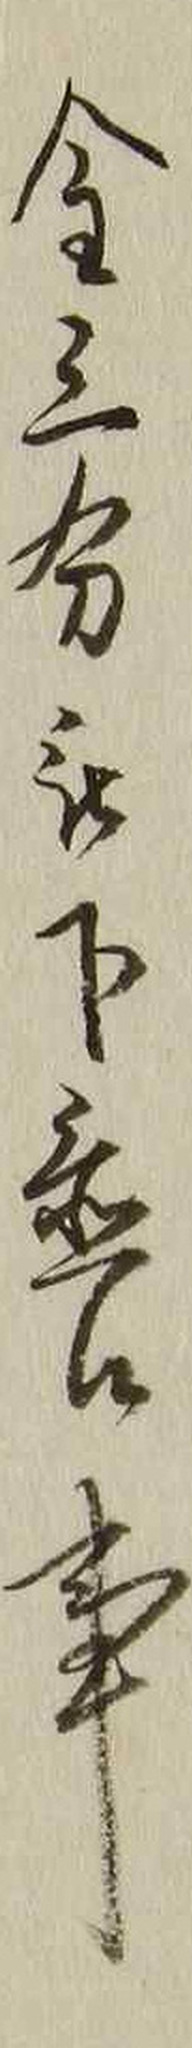金三分被下置候事
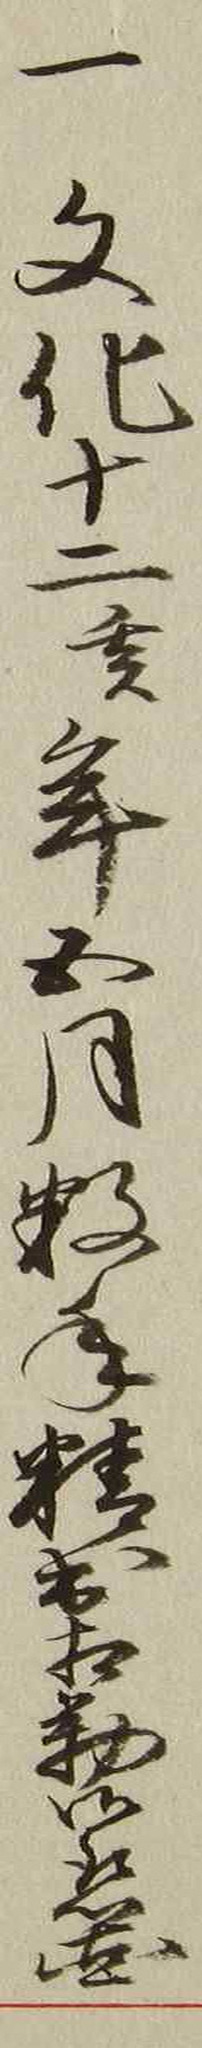一文化十二亥年五月数年精出相勤御取箇
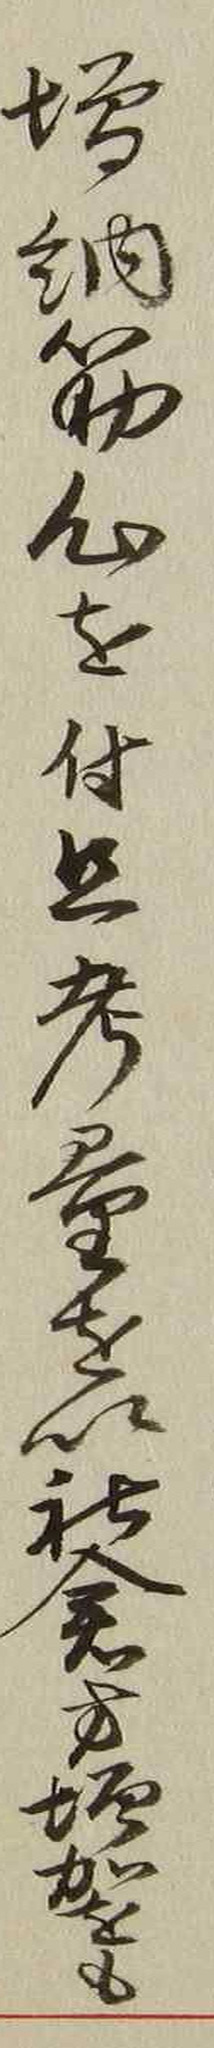増納筋心を付且考量を以社倉方増加をも
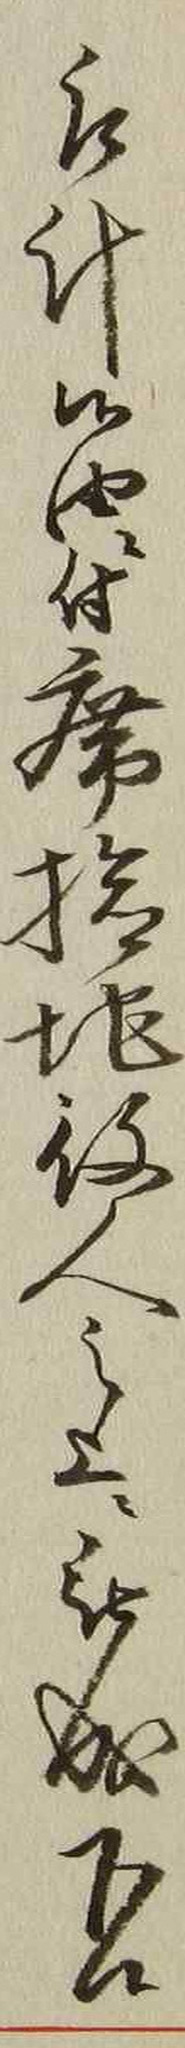取計候由ニ付席検地役人之上ニ被成下候
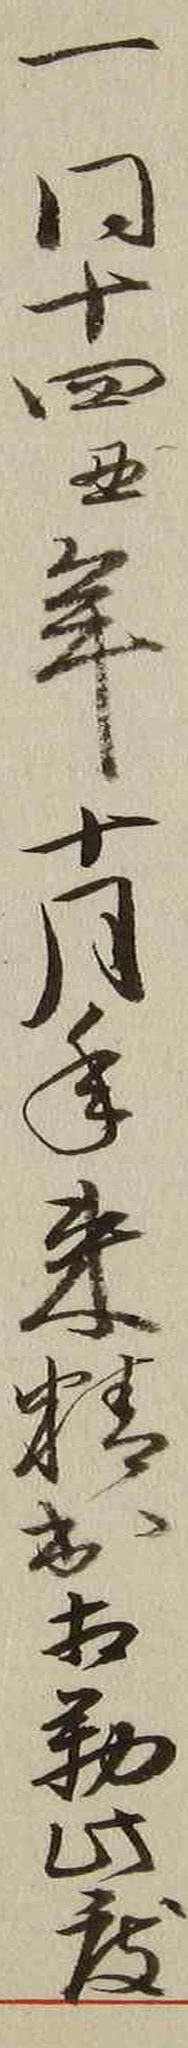一同十四丑年十月年来精出相勤此度
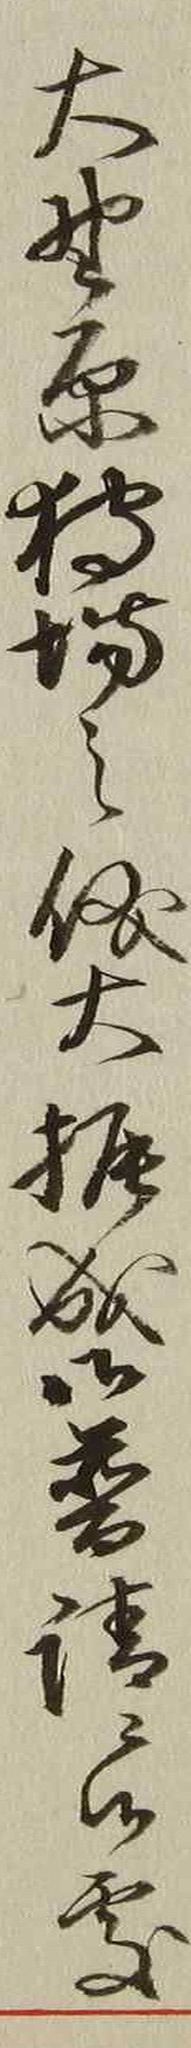大野原狩場之儀大掘成御普請ニ候処
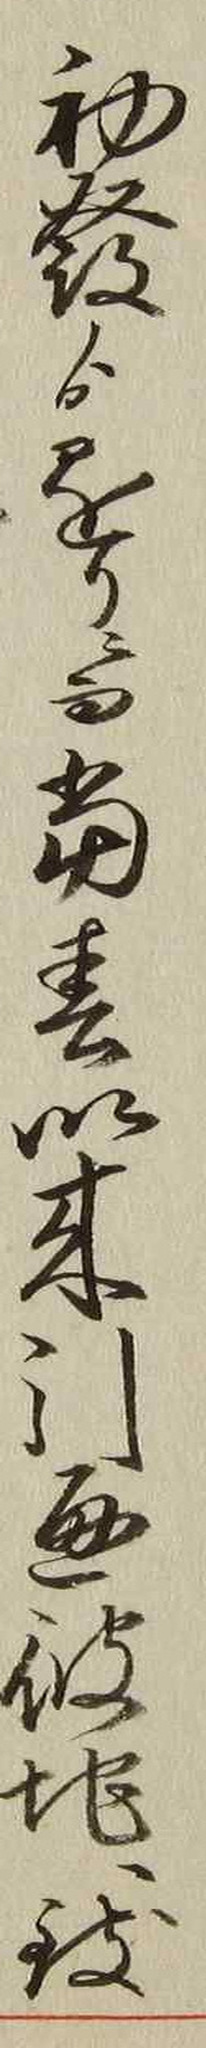初発ゟ懸りニ而当春以来引通彼地へ致
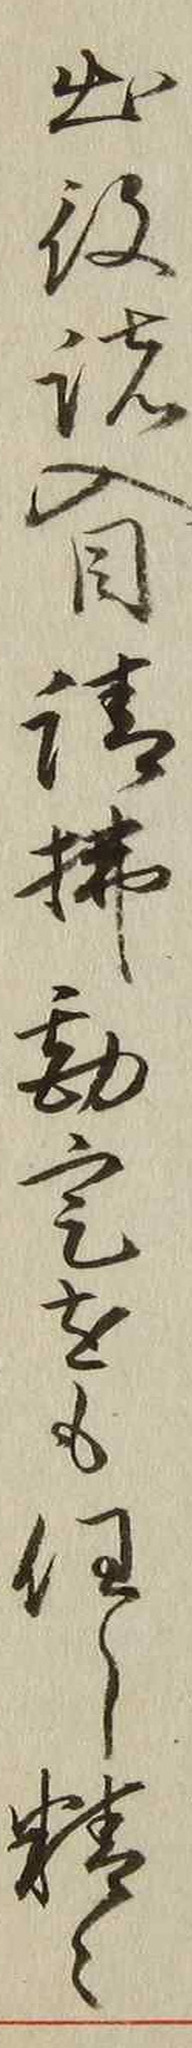出役諸入目請払勘定をも任し精々
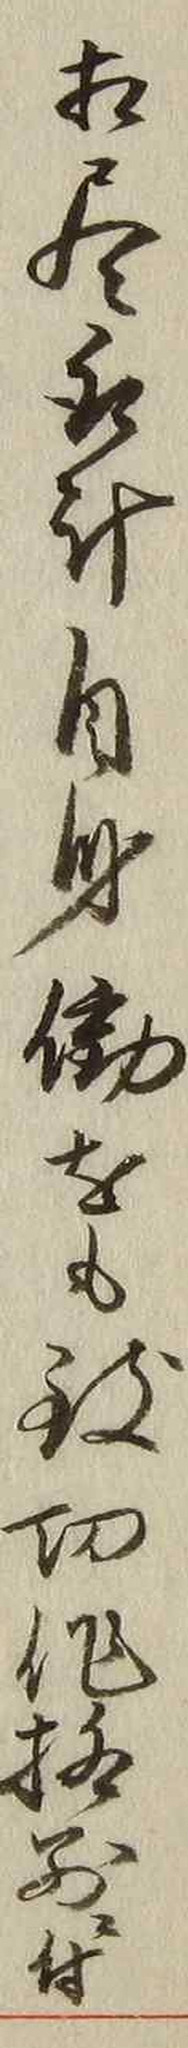相尽取計自身働をも致功作格別ニ付
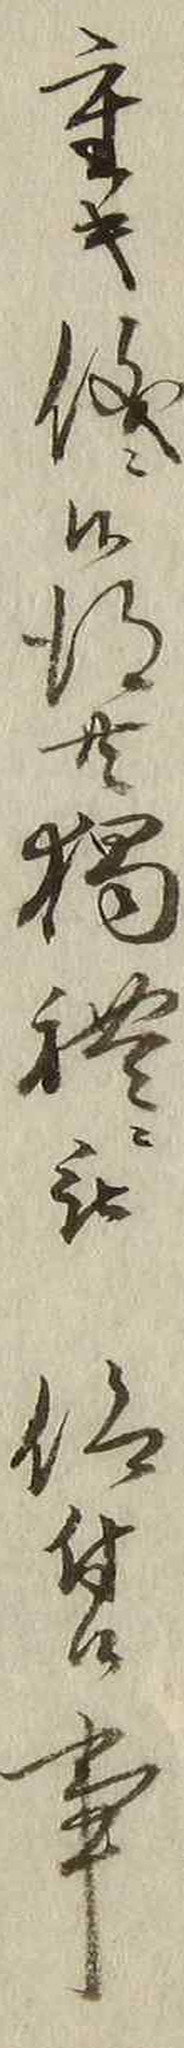重キ儀ニ候得共独礼ニ被仰付候事
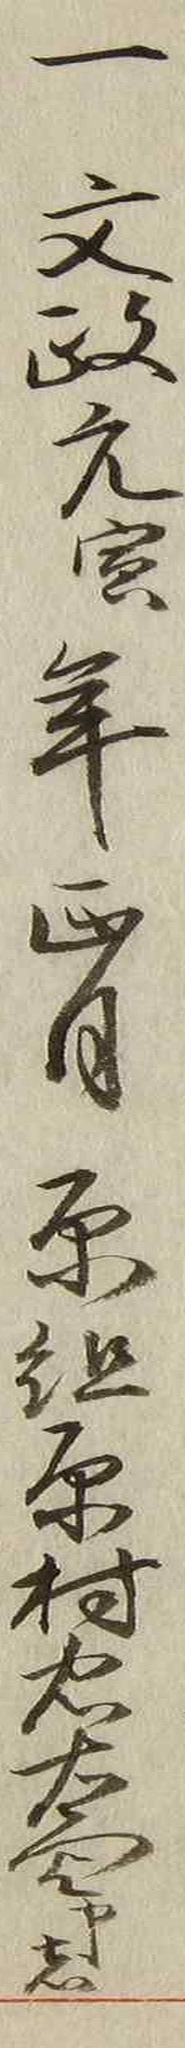一文政元寅年正月原組原村忠右衛門与申者
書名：諸士系譜　巻之102　か之部10
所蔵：会津若松市立会津図書館
